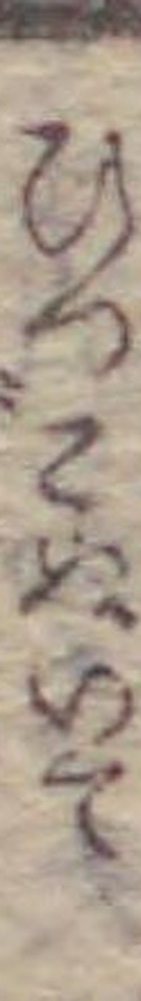ひつこぬいて
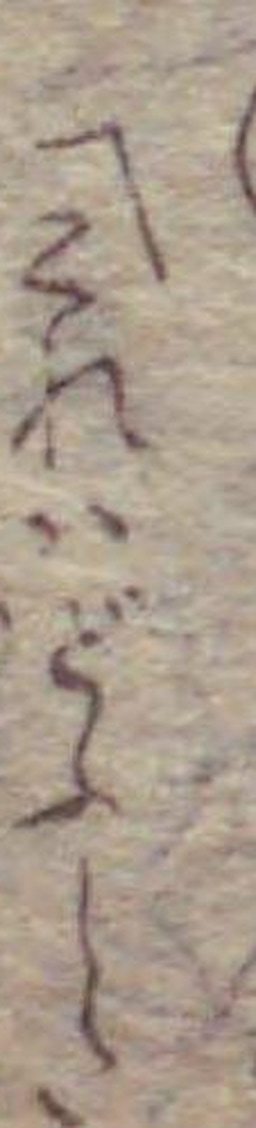〽これはどふした
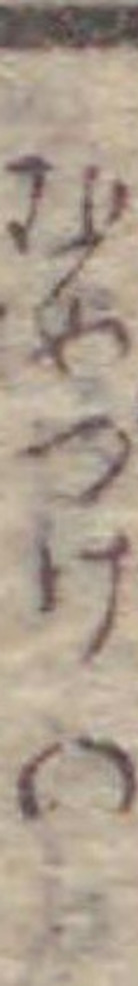むやづけの
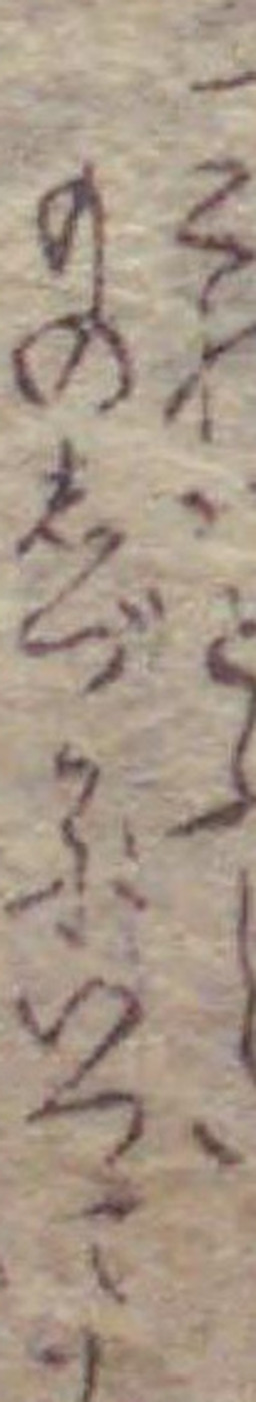ものしづかにいつても
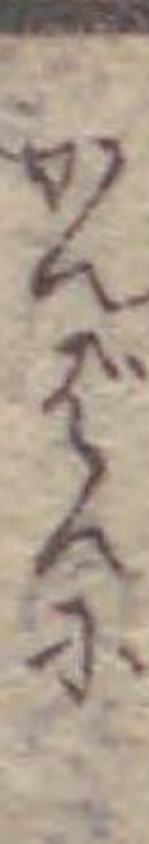かんばんに
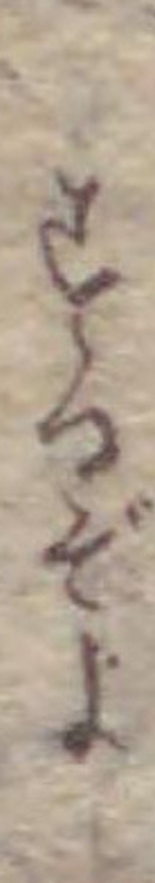するぞよ
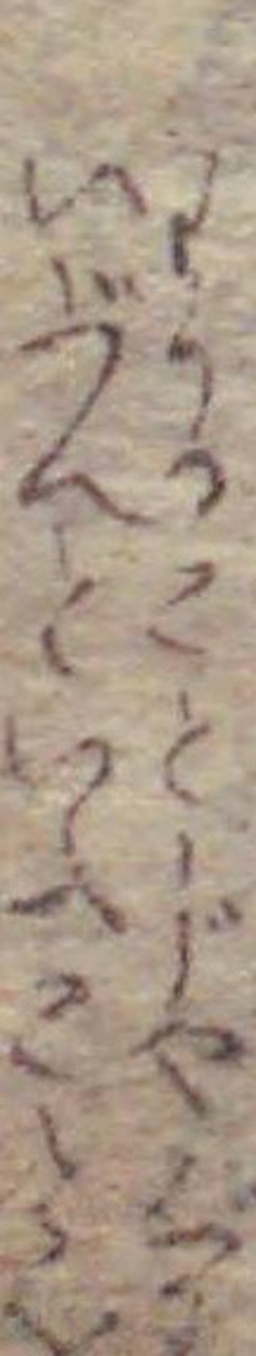いぶんといふことを
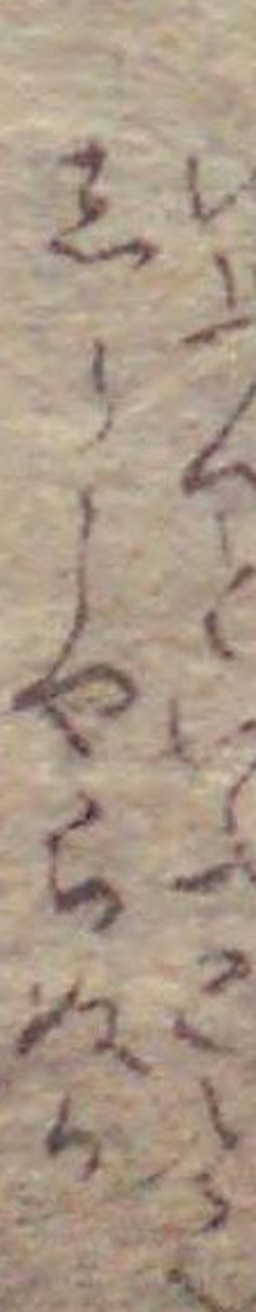しらしやらぬか

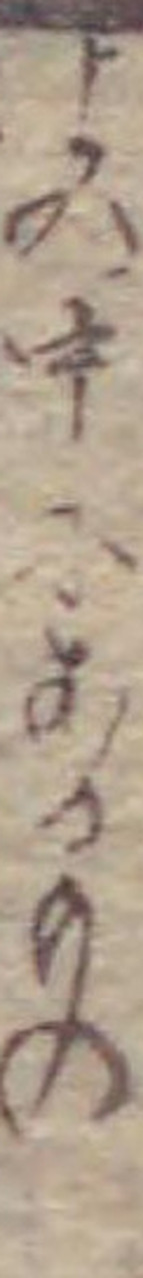よの中にあるもの
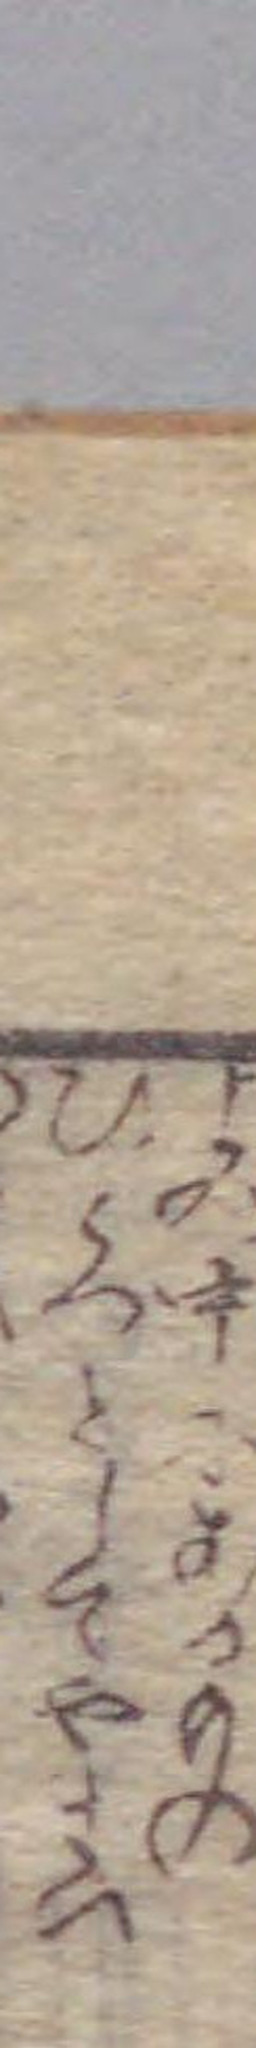ひとつとしてやまひ
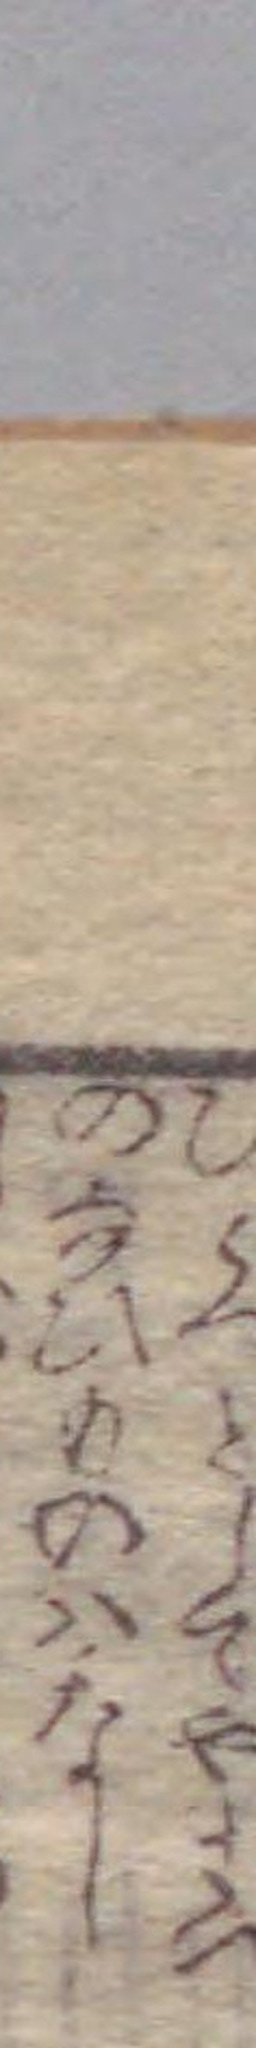のなひものはなし
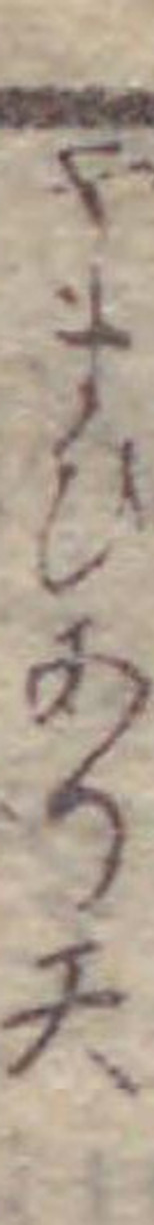やまひあり天
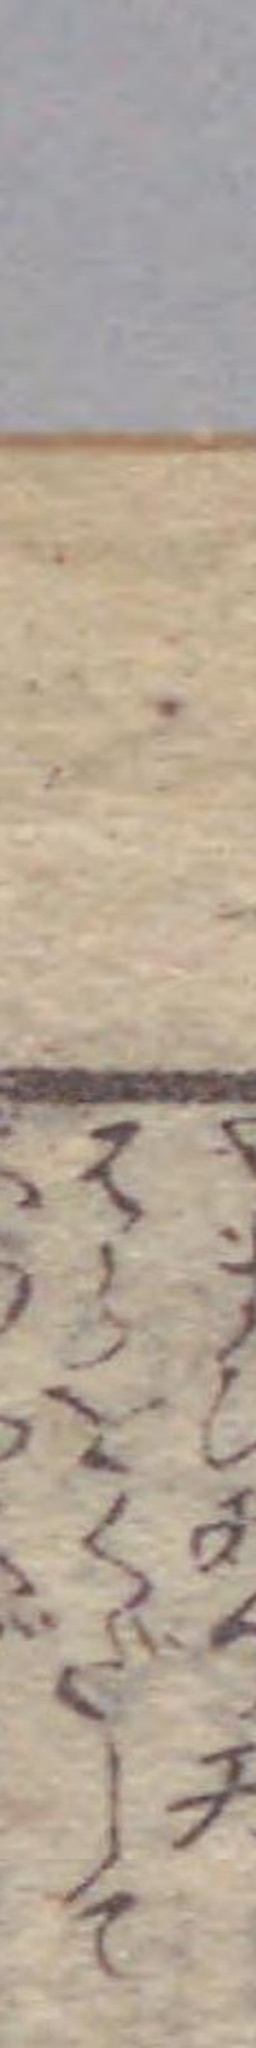はらをくだして
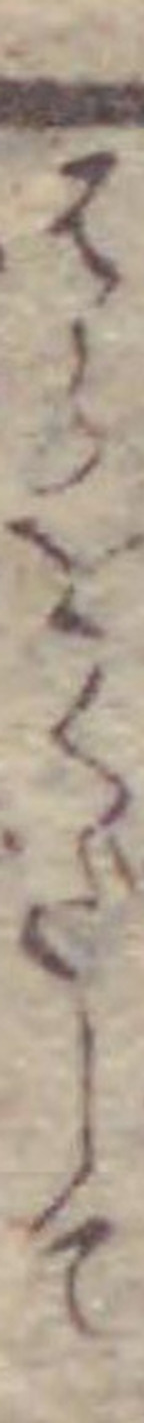はらをくだして
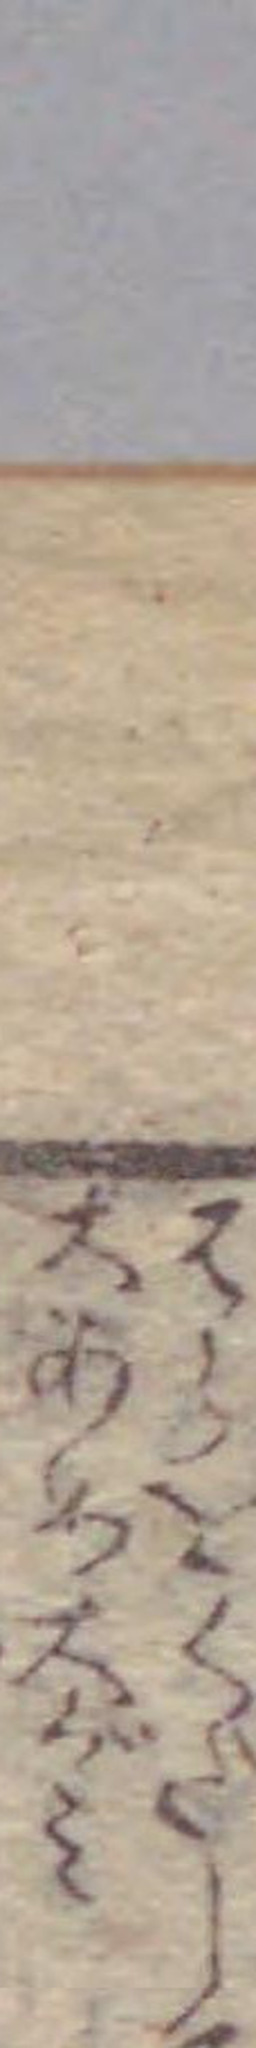大あめ大がみ
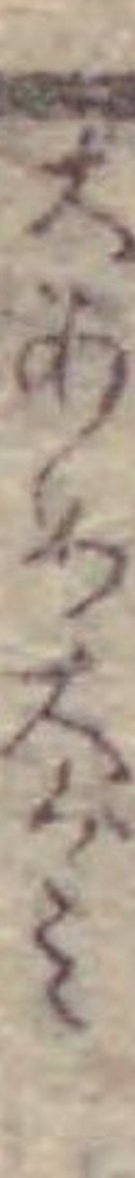大あめ大がみ
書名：鼻下長生薬 : 3巻
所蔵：国立国会図書館 National Diet Library, JAPAN
